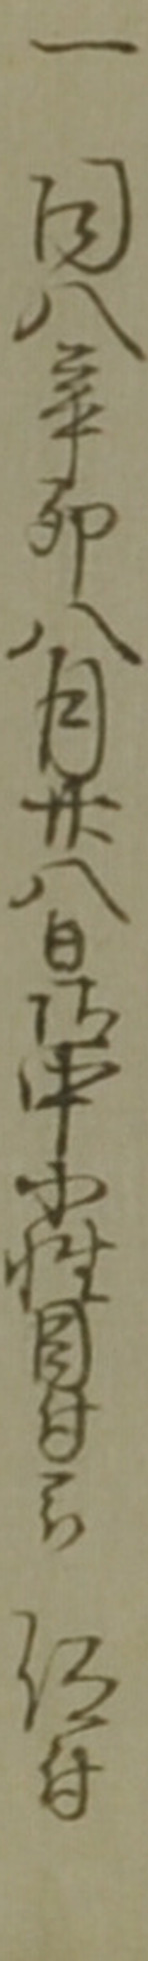一同八辛卯八月廿八日御中小性目付被仰付
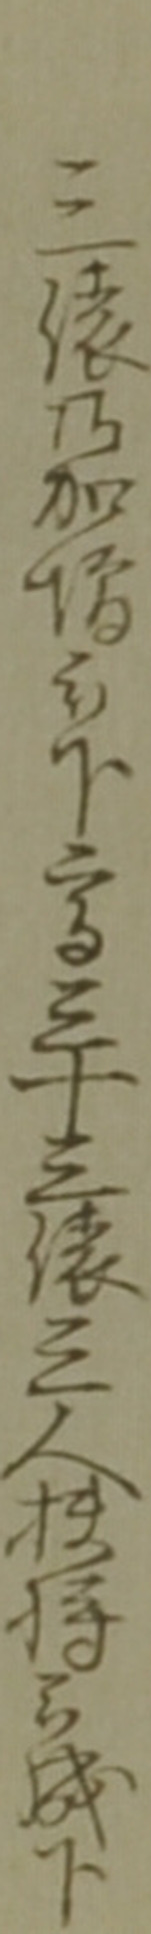三俵御加増被下高三十三俵三人扶持被成下
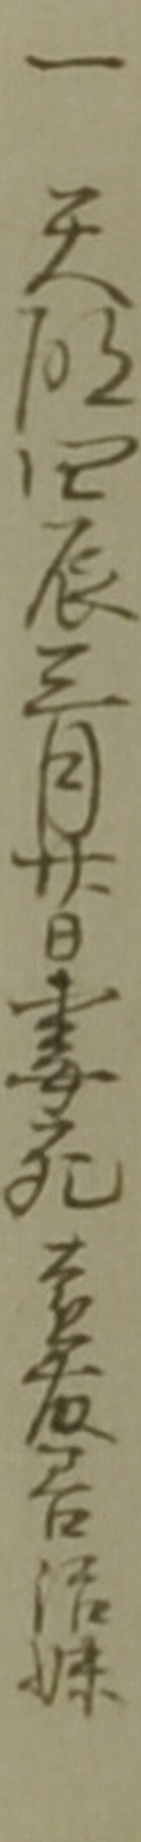一天明四辰三月廿日妻死遠藤善治妹
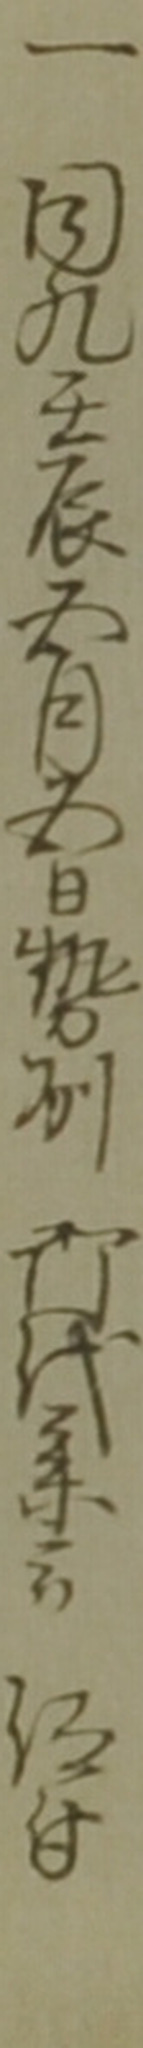一同九壬辰五月五日勢州御代参被仰付

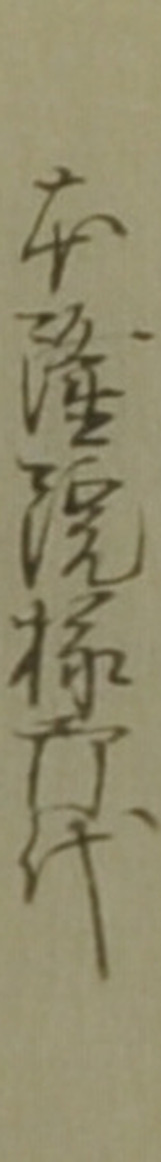本隆院様御代
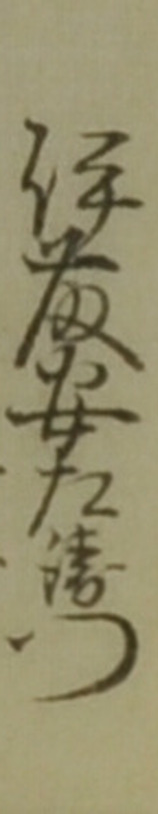伊藤安左衛門
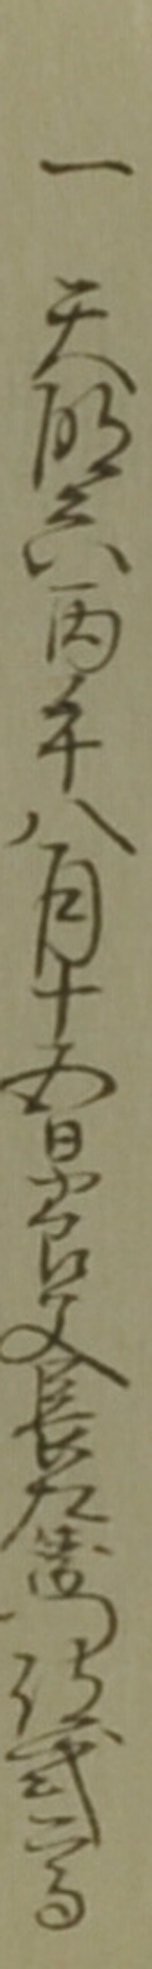一天明六丙午八月十五日養父長左衛門跡式高
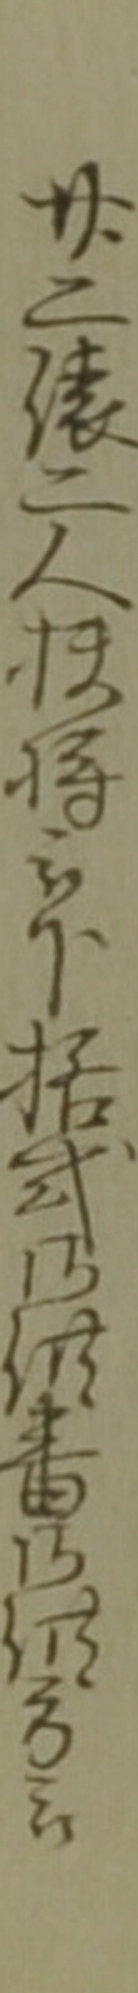廿二俵二人扶持被下格式御供番御供方被
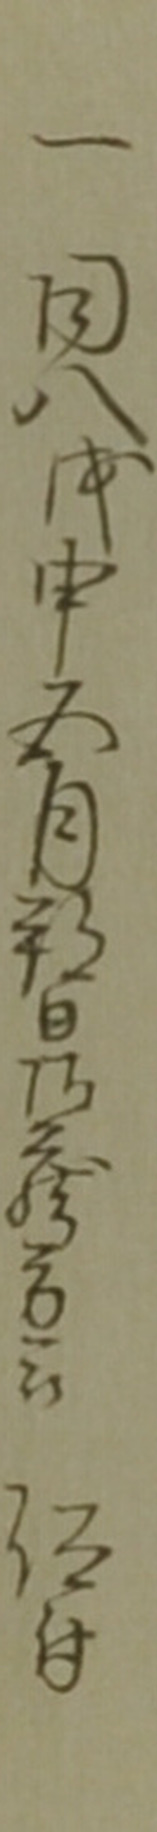一同八戊申五月朔日御蔵方被仰付
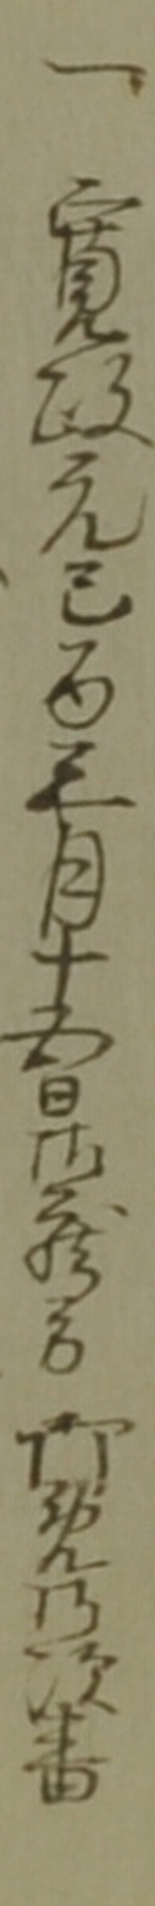一寛政元己酉三月十五日御蔵方御免御次番
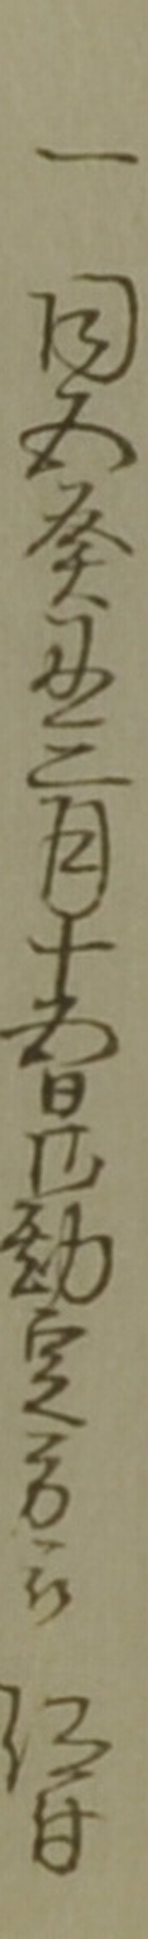一同五癸丑二月十五日御勘定方被仰付
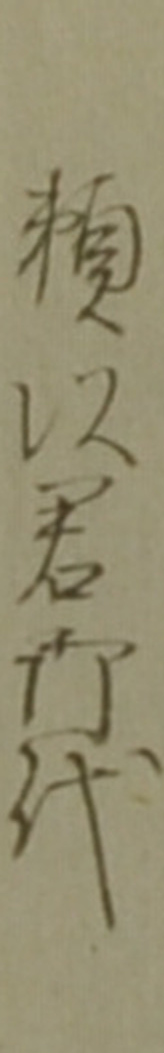頼以君御代
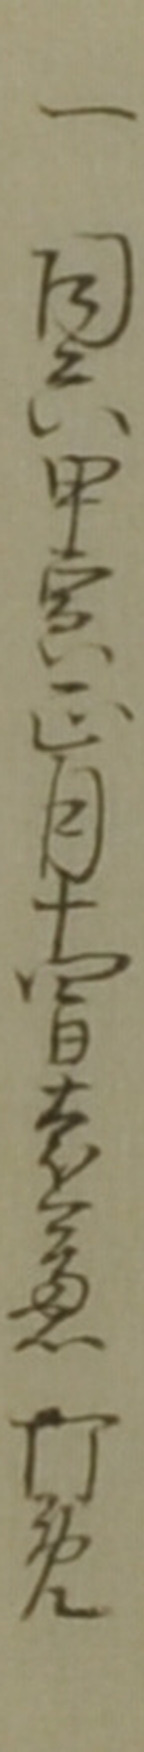一同六甲寅正月十四日遠慮御免
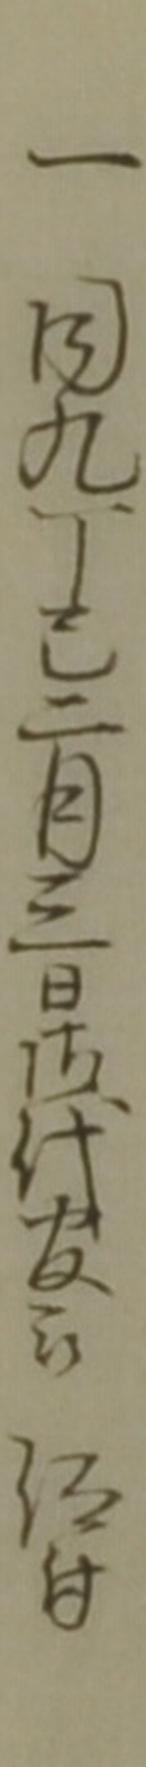一同九丁巳二月三日御代官被仰付
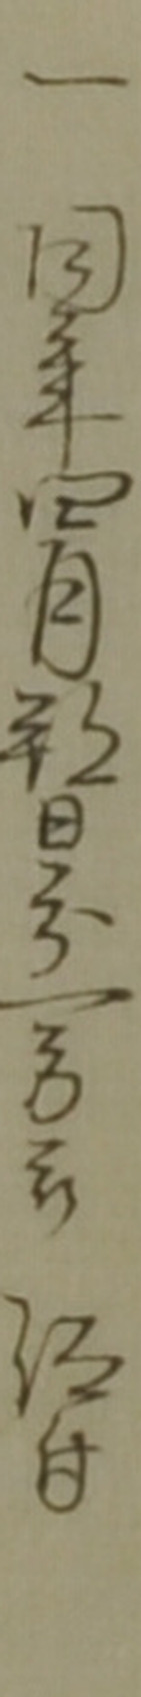一同年四月朔日分一方被仰付
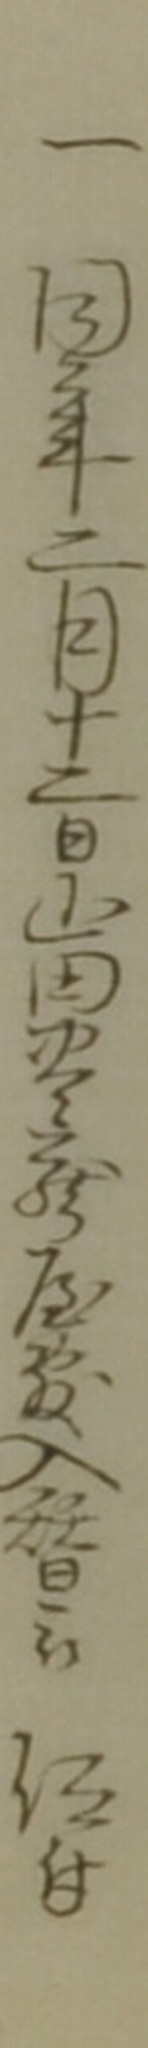一同年二月十二日山田尽蔵屋敷入替被仰付
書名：無足廃家（壱）
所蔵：伊那市立高遠町図書館・合同会社AMANE
